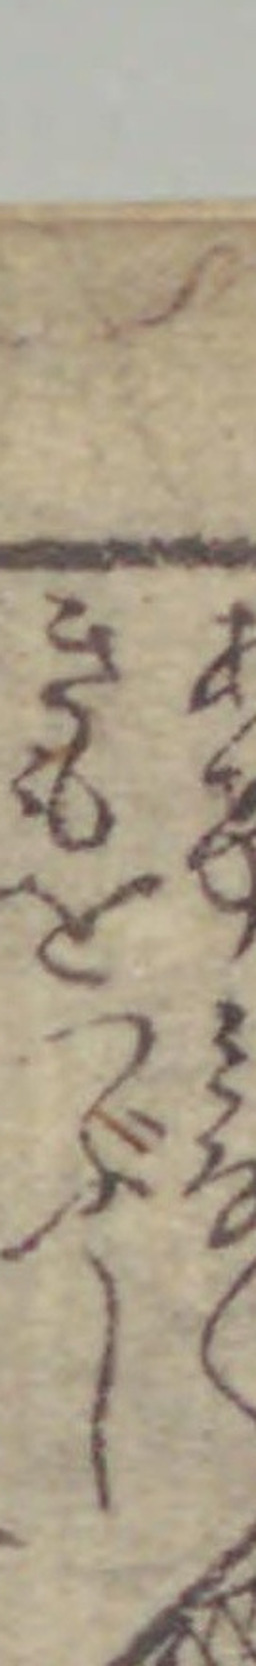きもをつぶし
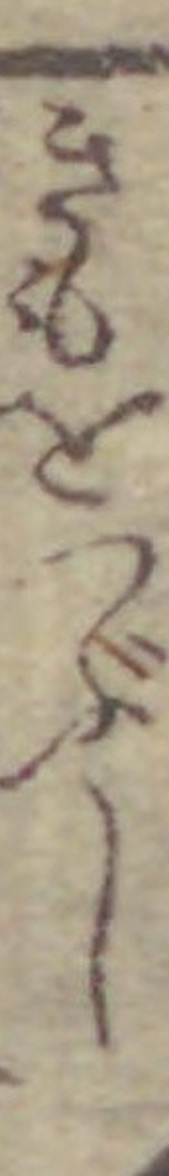きもをつぶし
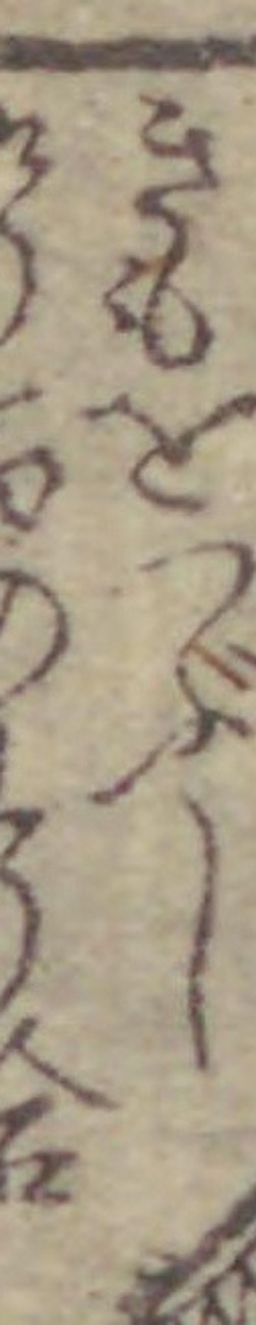けり百のわり合
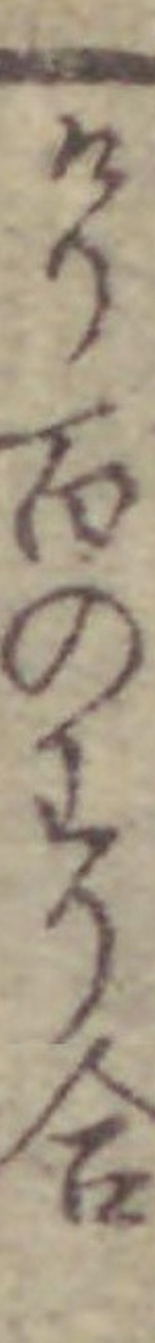けり百のわり合
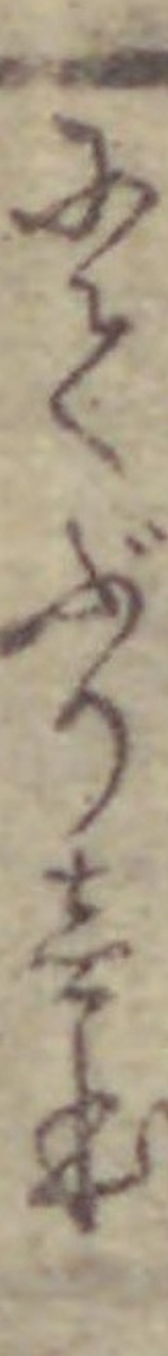にてぶり一本
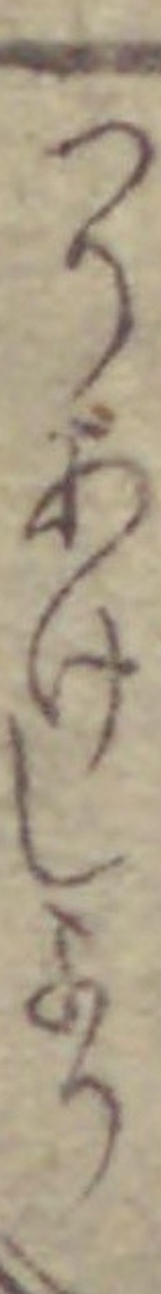つりあけしより
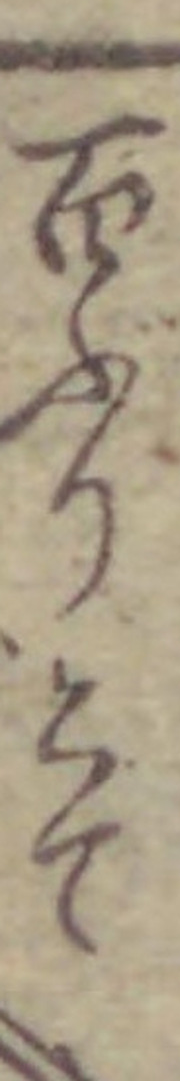百ぶりとて
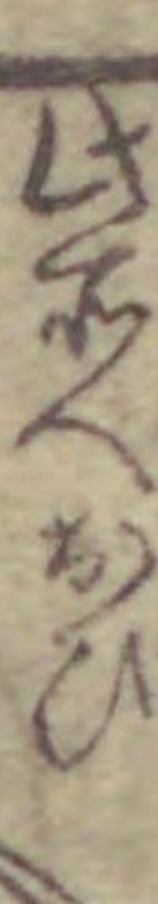此所へおび
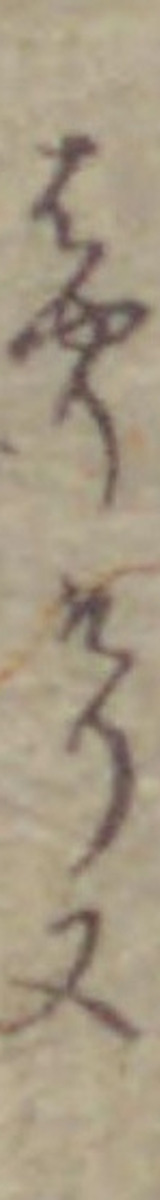はやりけり又
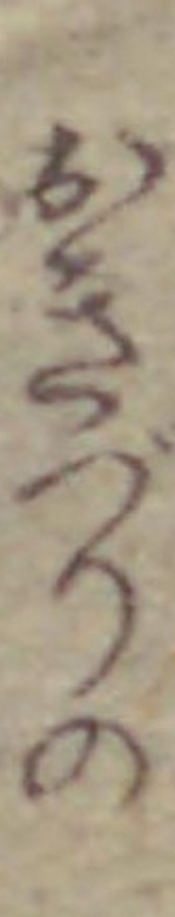おきづりの
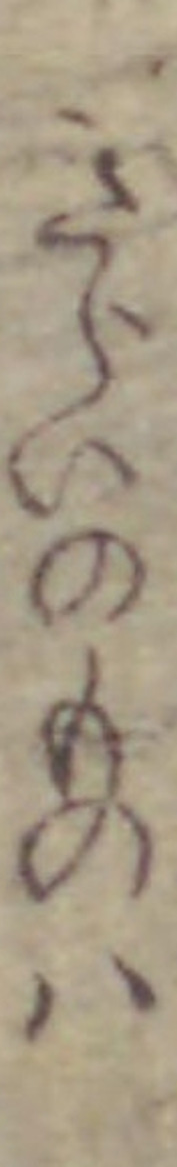きらいのものは
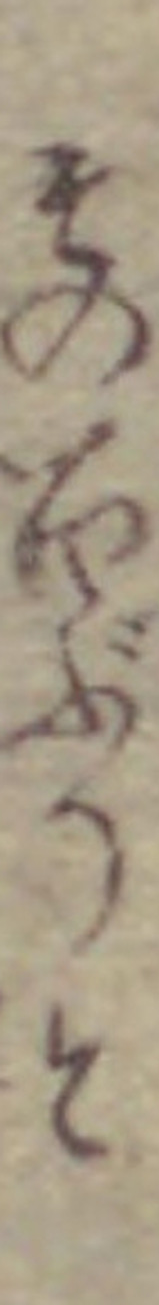その百ぶりと
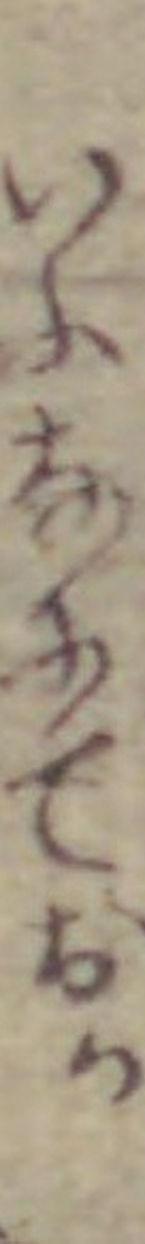いふなにておか
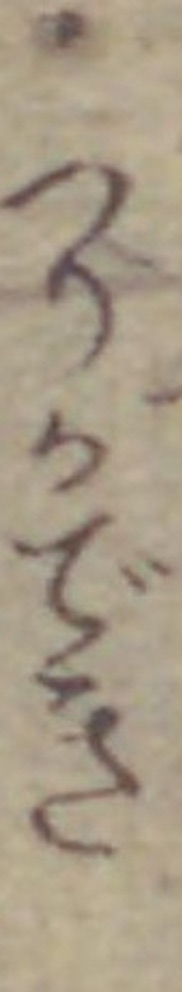つりかでき
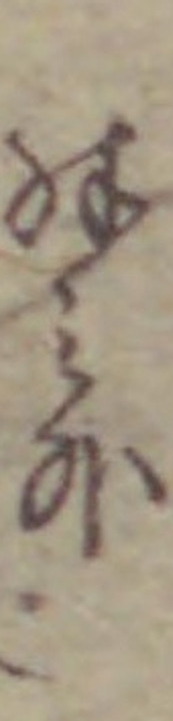殊之外
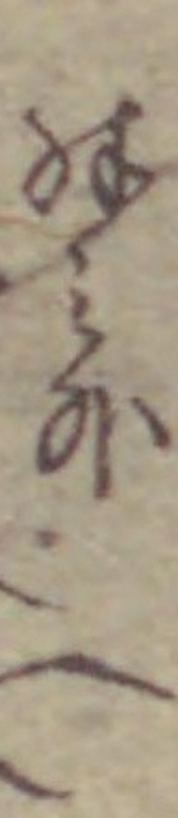殊之外
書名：親父布子鳶握 3巻
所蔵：国立国会図書館 National Diet Library, JAPAN
